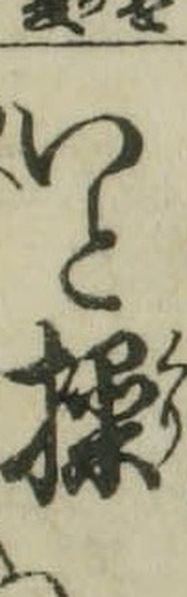いと繰
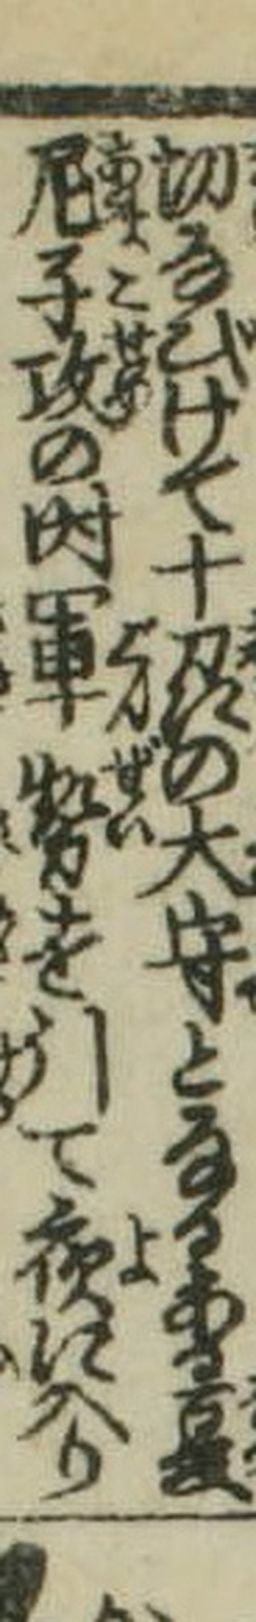尼子攻の時軍勢を引て夜に入り
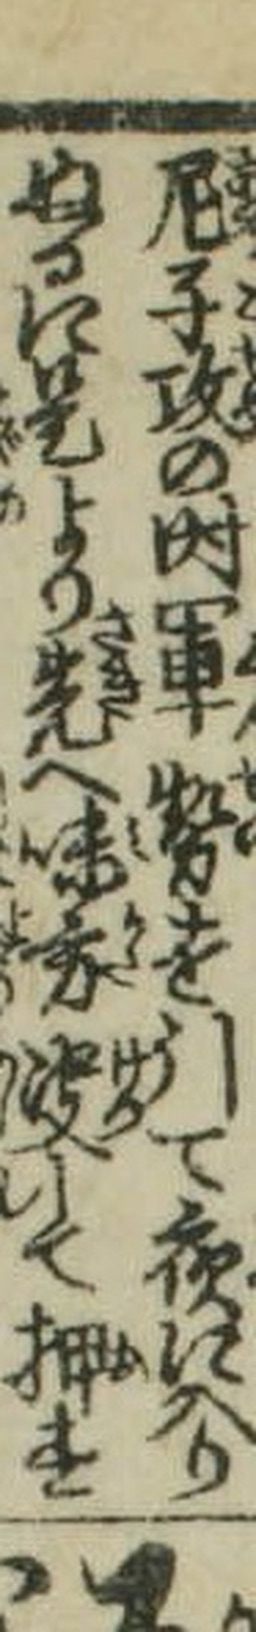ぬるに是より先へ味方決して押す
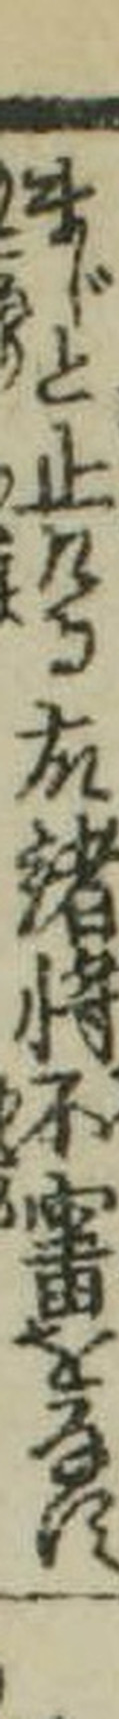まじと止ける故諸将不審をなす
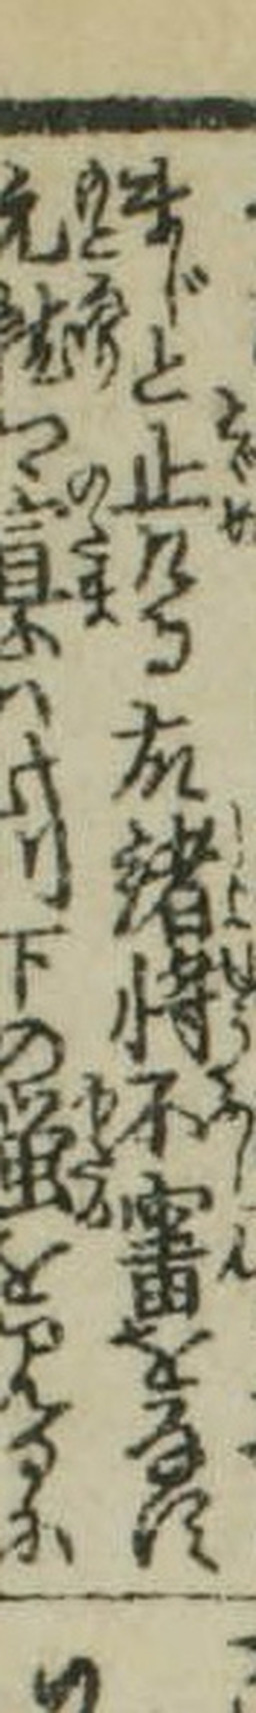元就卿宣ふは此川下の蛍を見るに
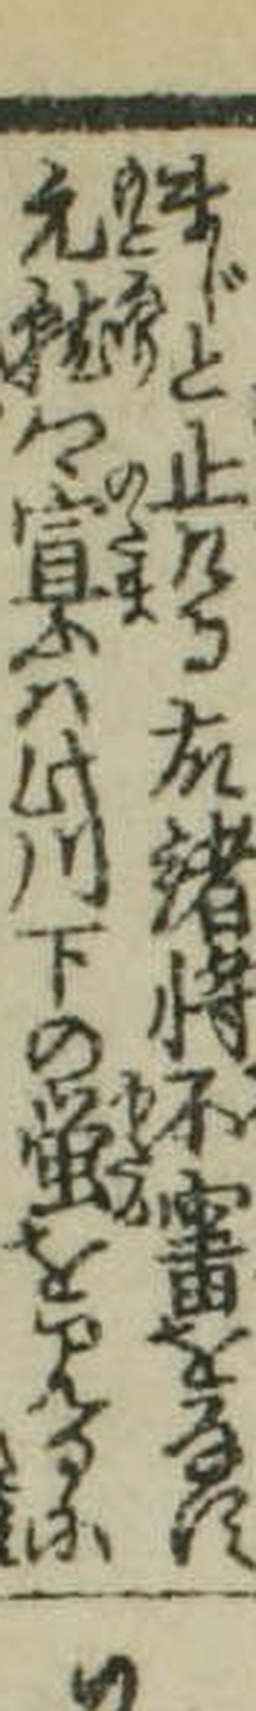元就卿宣ふは此川下の蛍を見るに
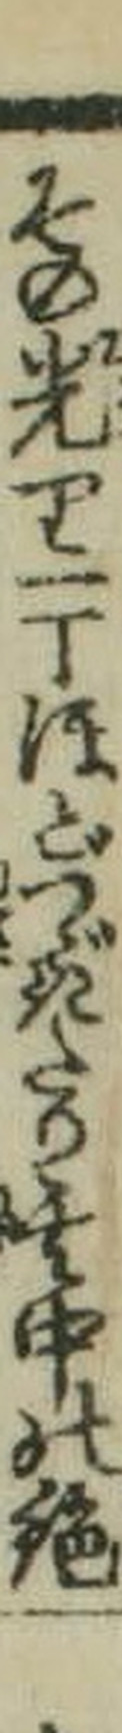その光り一丁ほどつゞきたり其中の絶
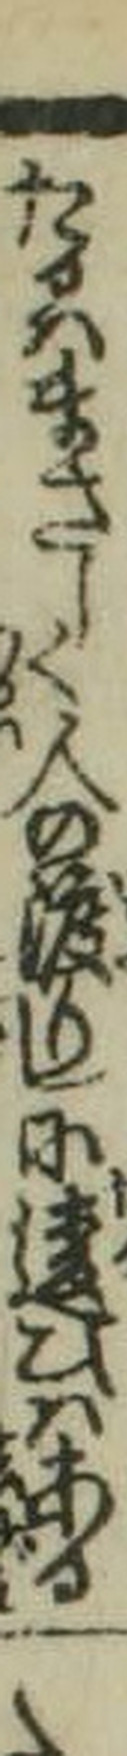たるはまさしく人の渡りしに違ひはある
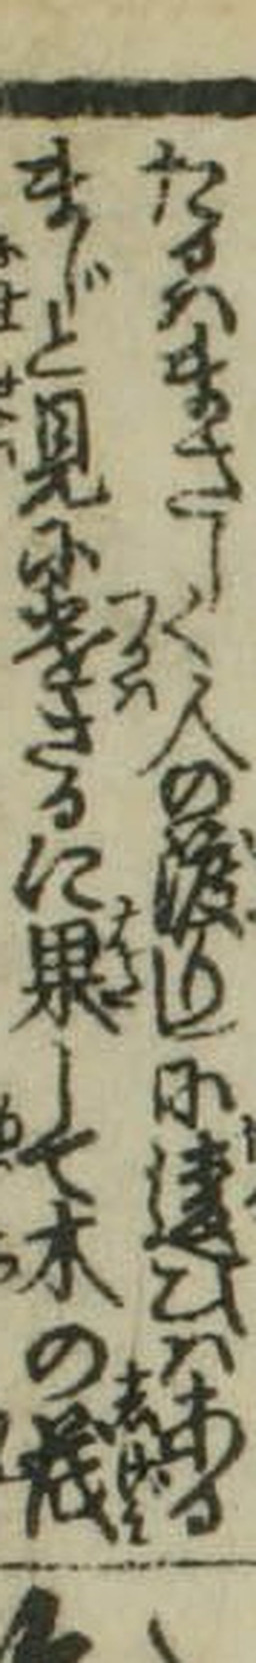まじと見に遣さるに果して木の茂
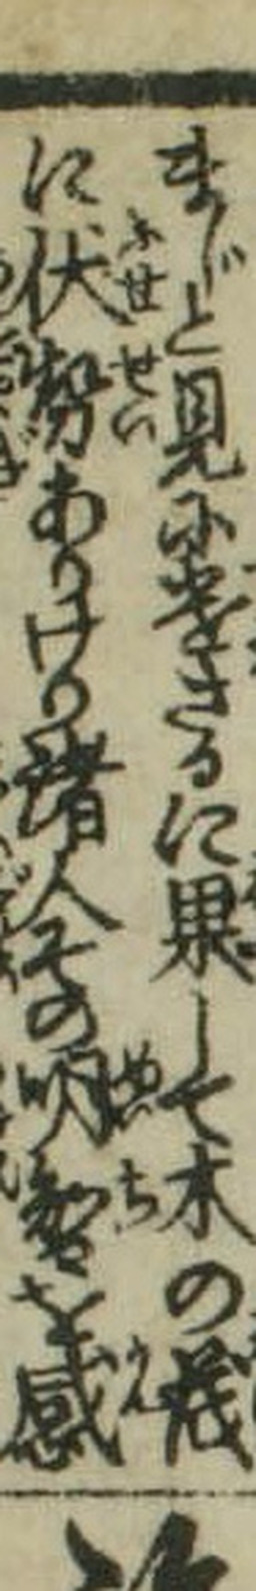に伏勢ありけり諸人その明智を感
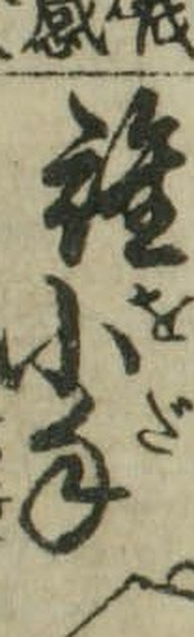誰小手
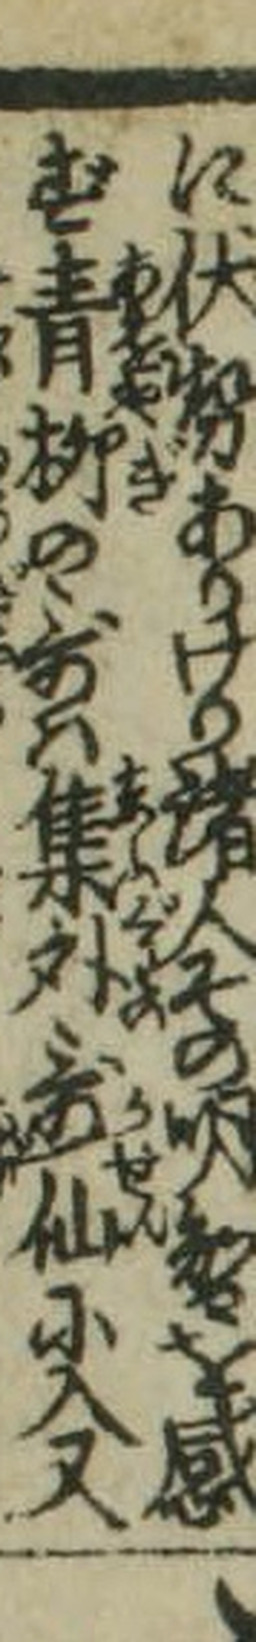ず青柳の歌は集外歌仙に入又
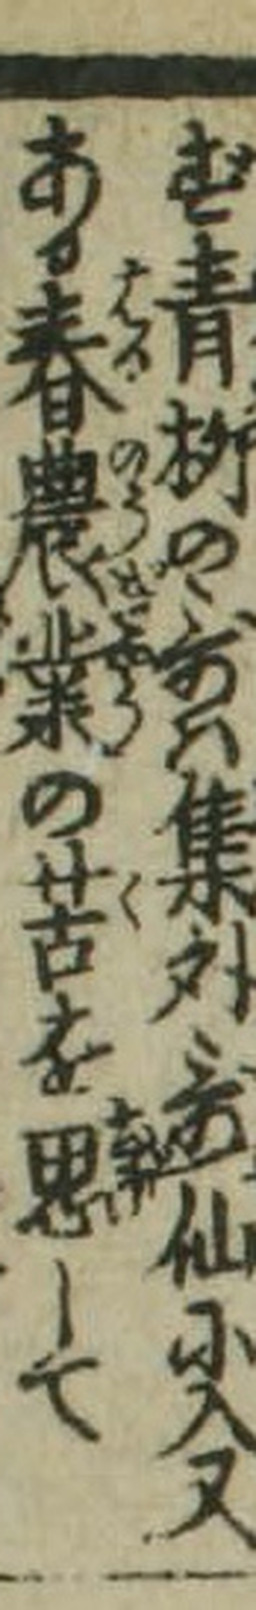ある春農業の苦を思して
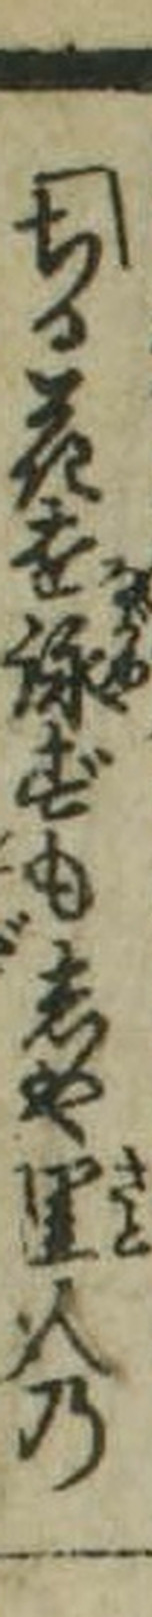〽ちる花を詠ずもしや里人の
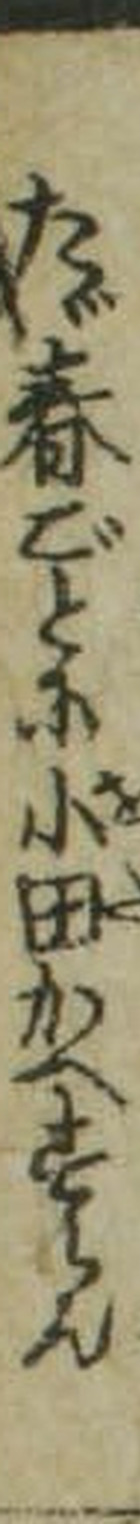たゞ春ごとに小田かへすらん
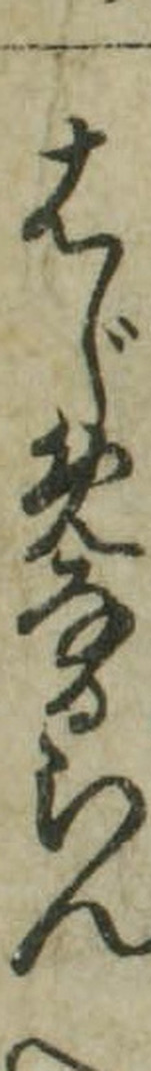はじめなるらん
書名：續英雄百人一首
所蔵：東京学芸大学附属図書館
